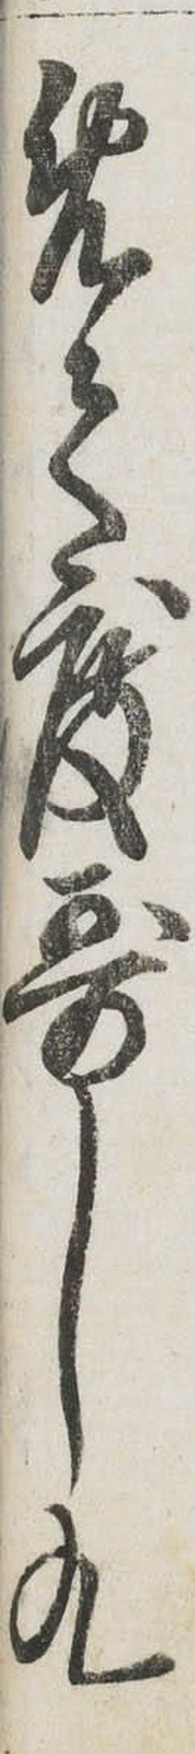めて度かしく
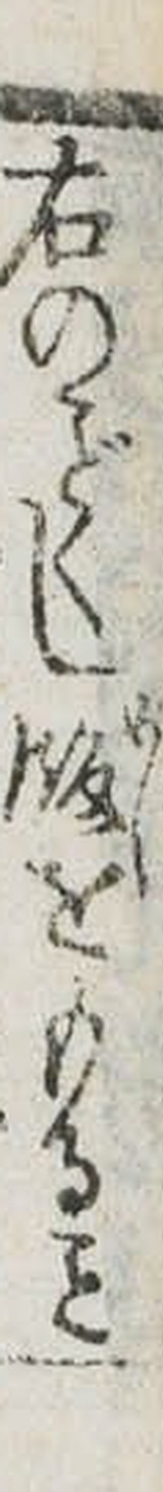右のごとくし飯をもること
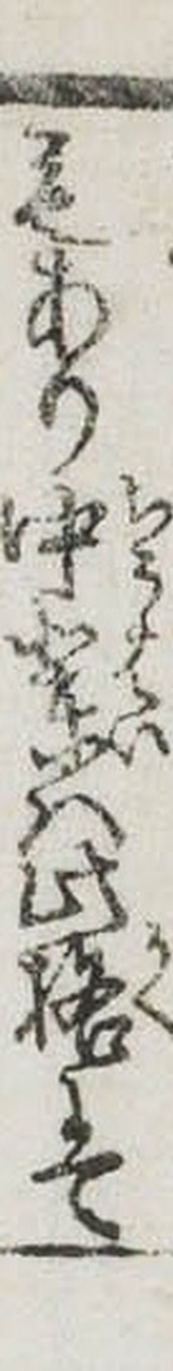もあり中輩は此格にて
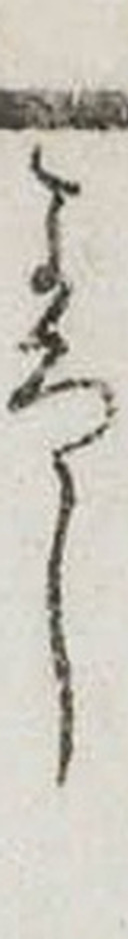よろし
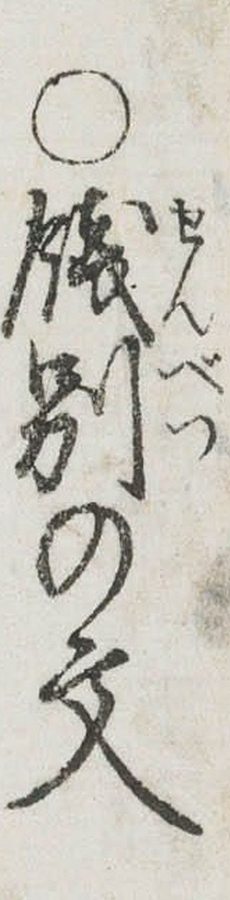○餞別の文
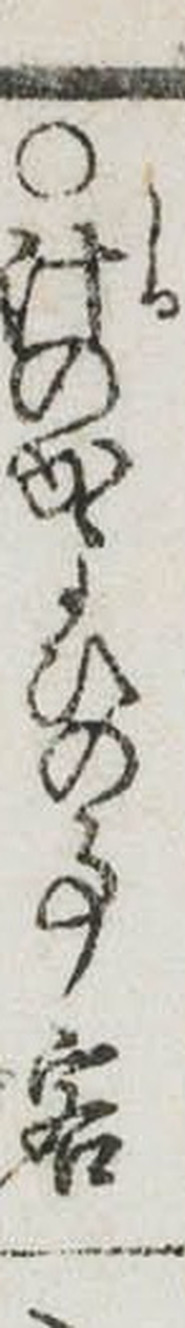○汁のかよひの事客
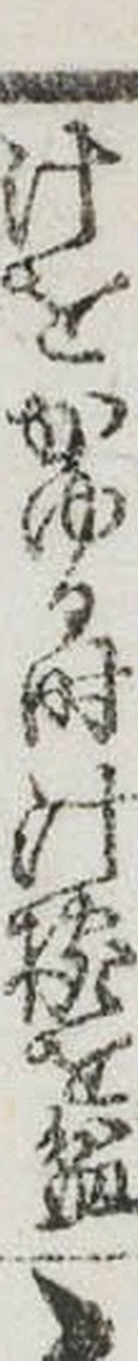汁をかゆる時汁椀を盆
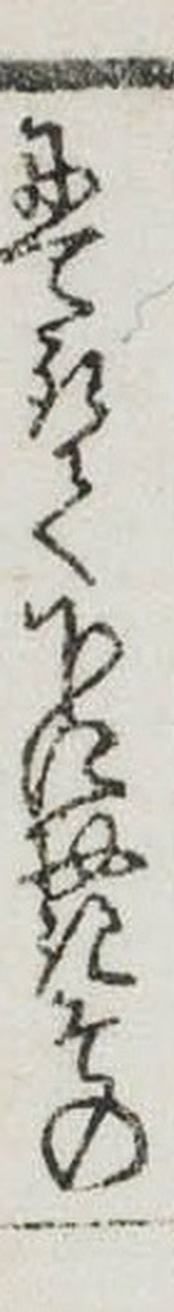にて取て下におきその
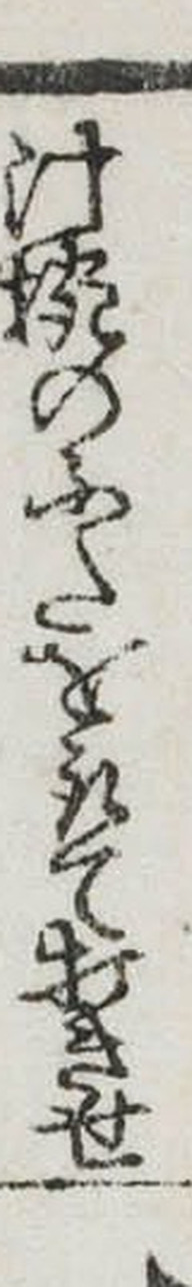汁椀のふたを取て打きせ
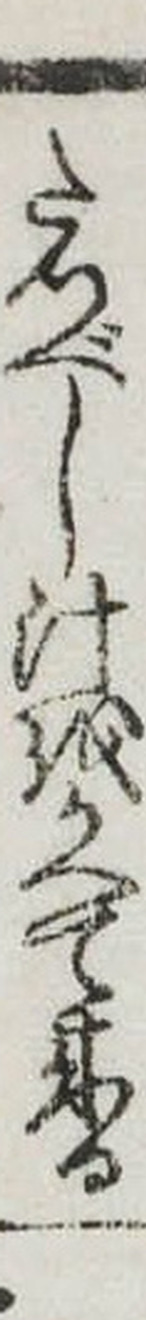たつべし汁をかへて来る
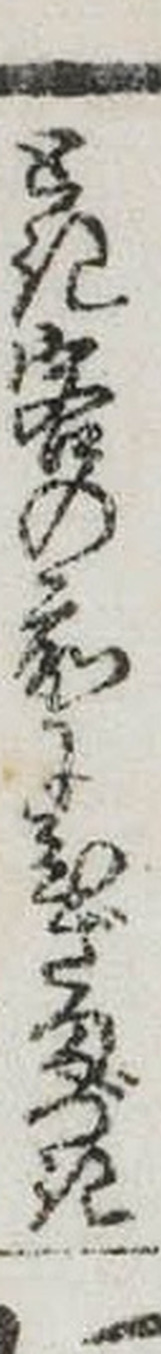とき客の前にひざまづき
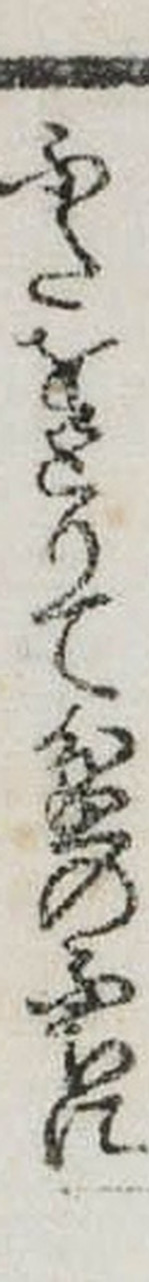ふたをとりて盆のふちに
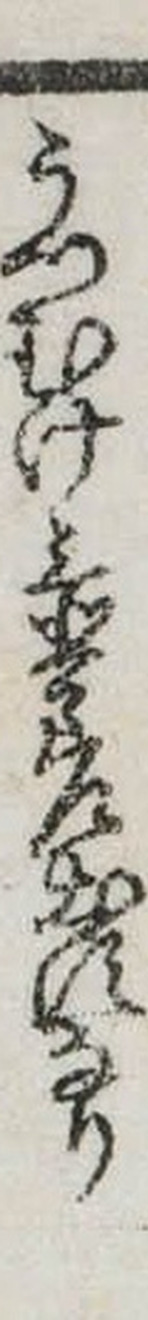うつむけ置差出すなり
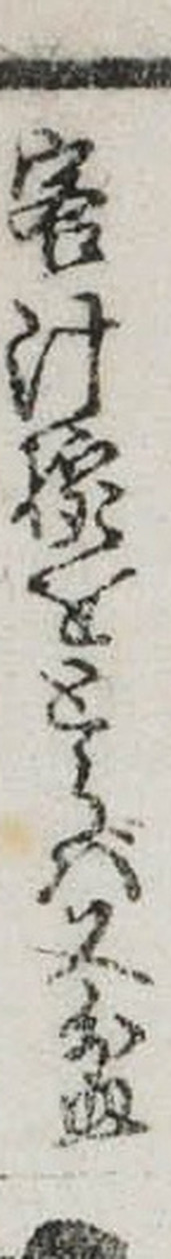客汁椀をとらば又盆
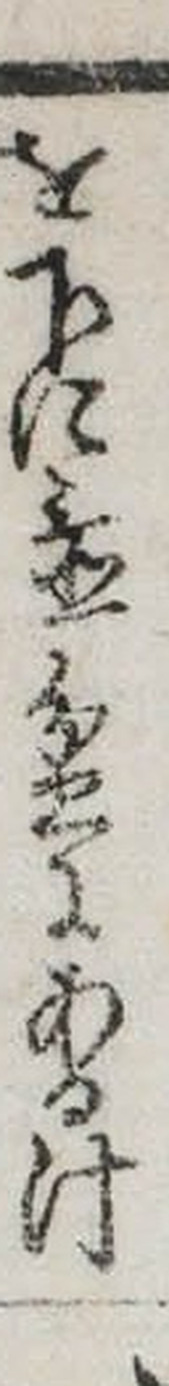を下に置盆にある汁
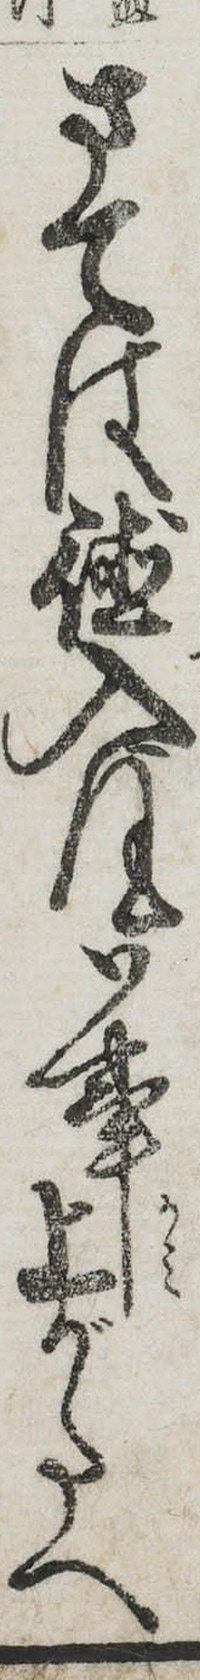さては徳入さま御事上がたへ
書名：頭書萬用婦人手紙之文言
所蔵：東京学芸大学教育コンテンツアーカイブ
